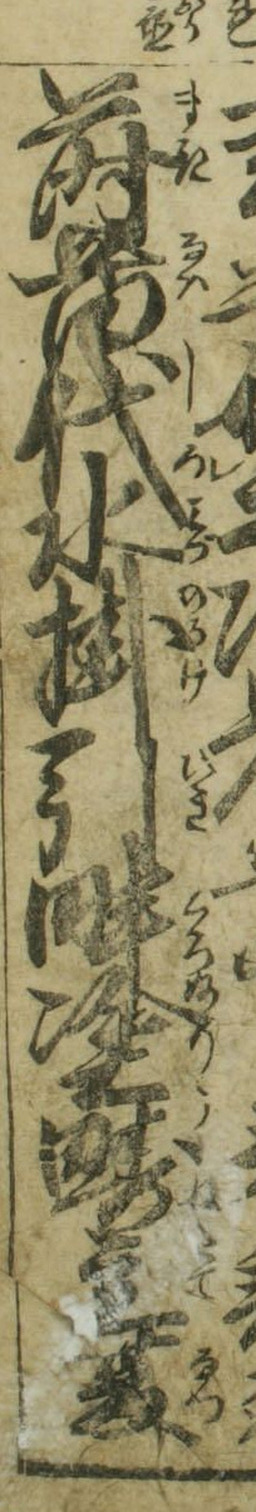蒔苗代水掛引畔塗畦立夏

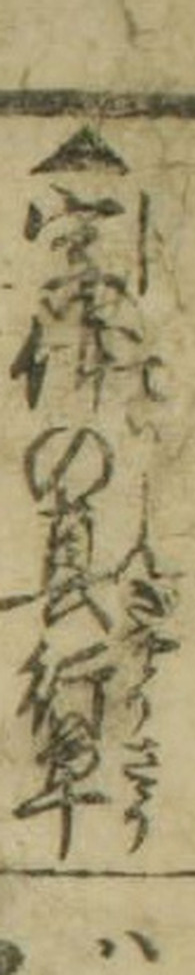▲字体の真行草
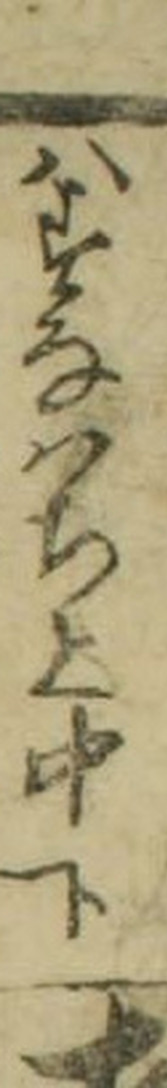はすなはち上中下
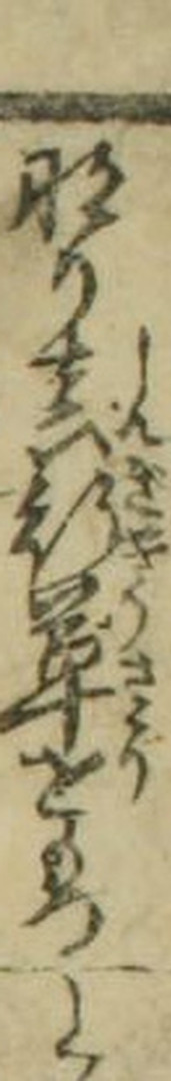なり真行草をもつ
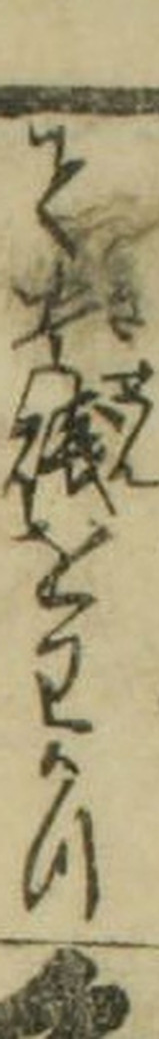て貴賤をわかつ
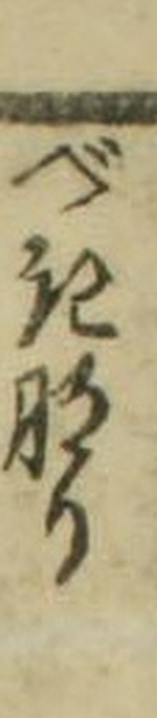べきなり
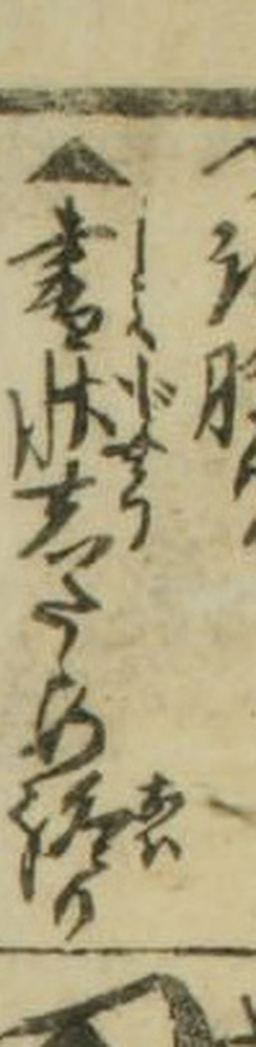▲書状したゝめ終り
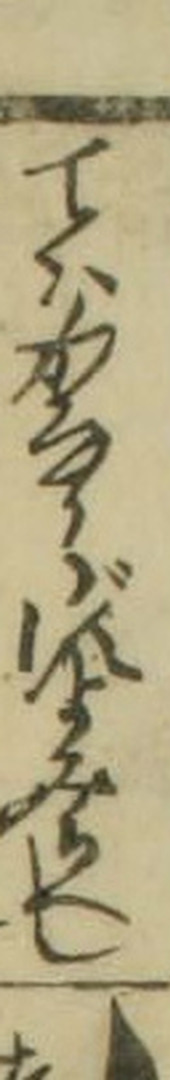てはかならずよみかへし
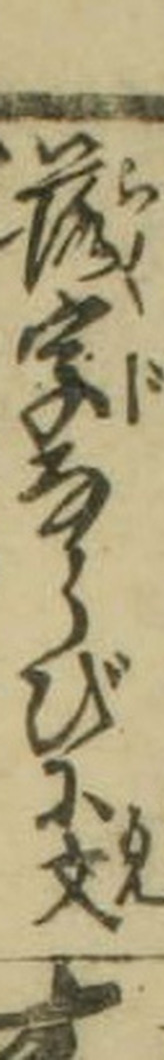落字ならびに文
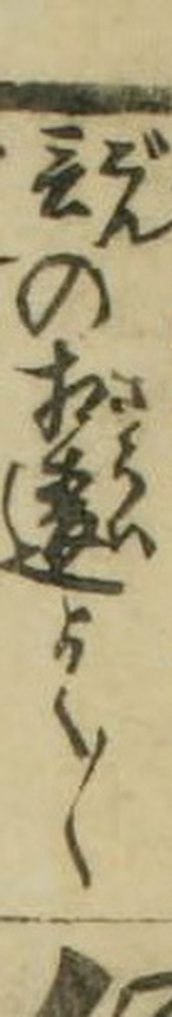言の相違よく〳〵
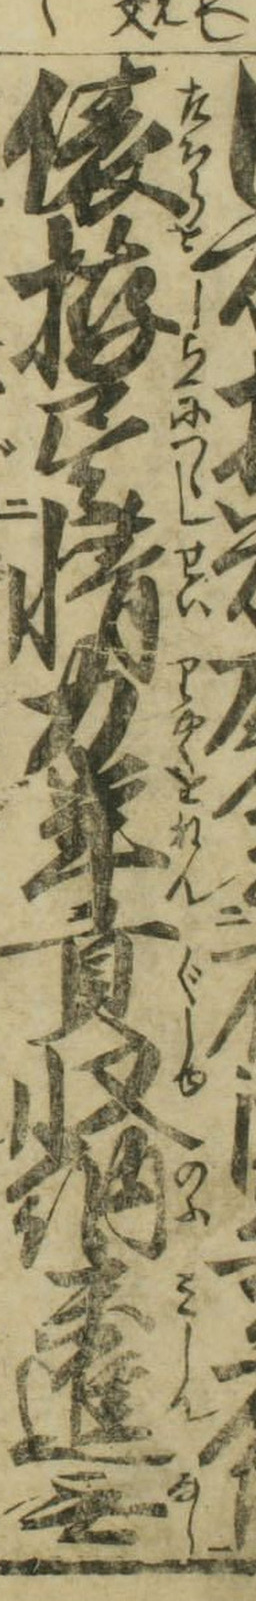俵拵尽情力年貢収納未進無
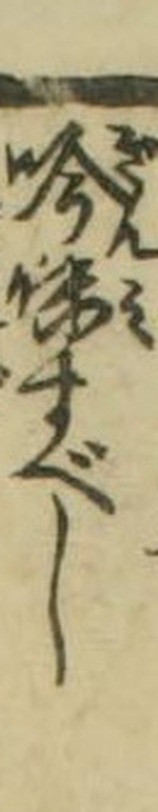吟味すべし
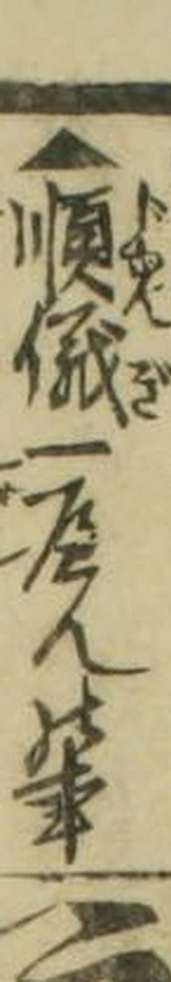▲順儀一へんの書
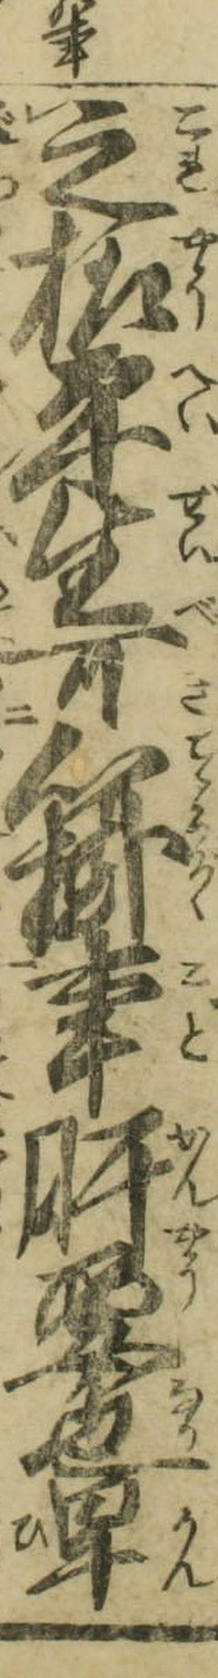之様平生可心掛事肝要也旱
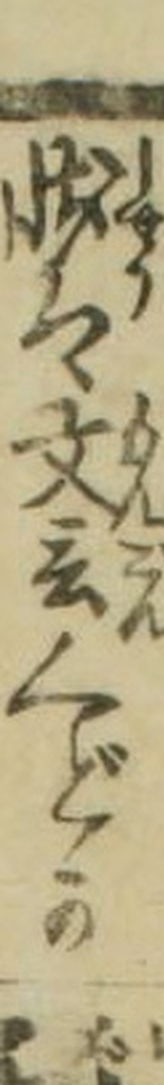状は文言くどか
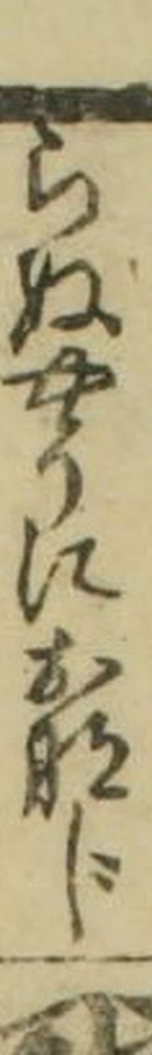らぬやうにおなじ
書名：増補職人往来
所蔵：東京学芸大学教育コンテンツアーカイブ
